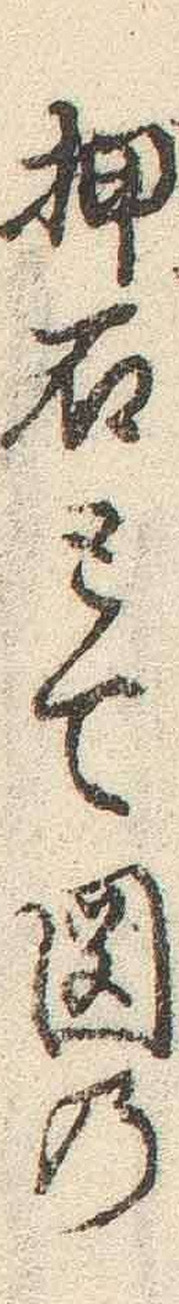押石とて図の
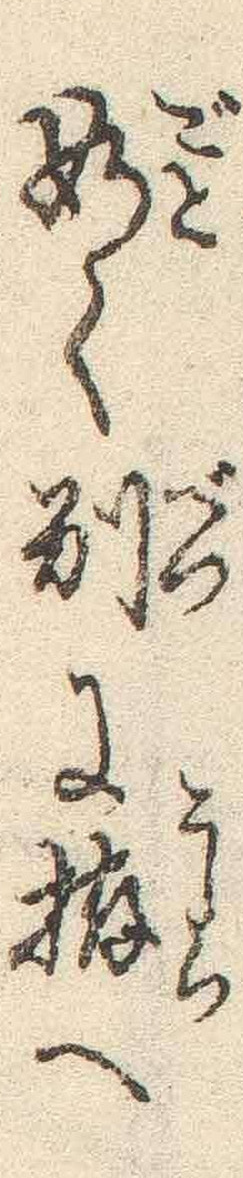如く別に拵へ
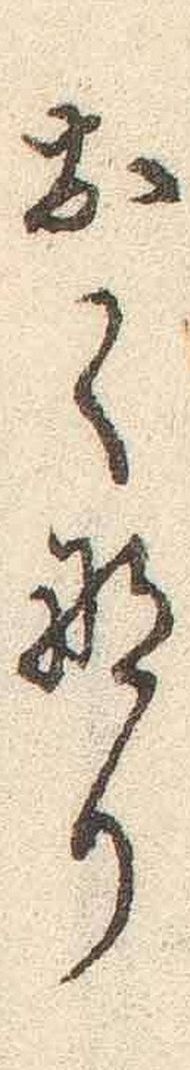おくなり
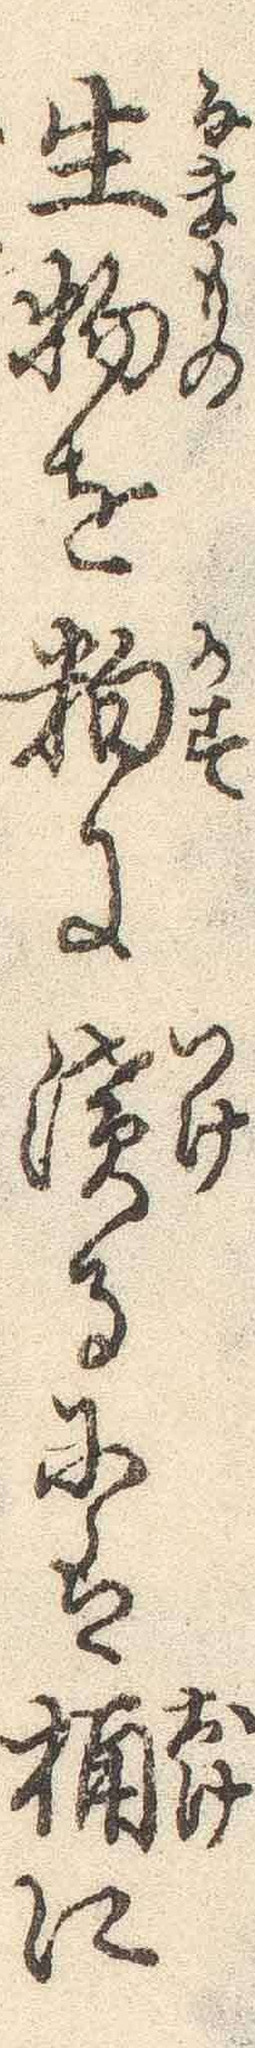生物を粕に漬るには桶に
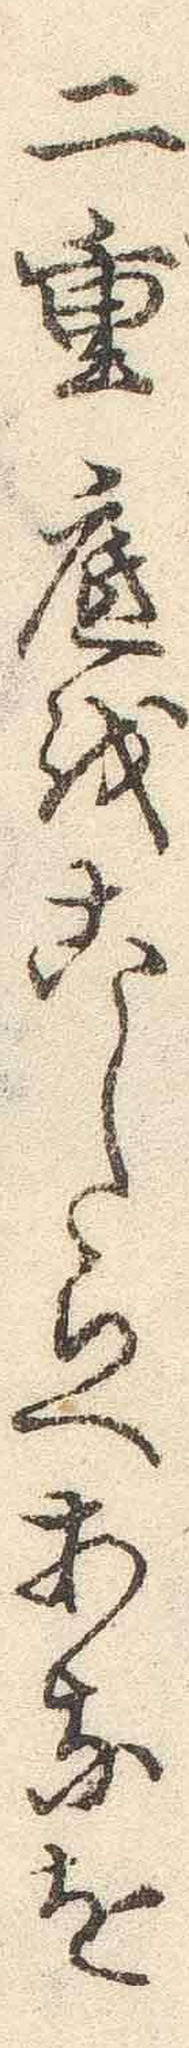二重底をこしらへあなを
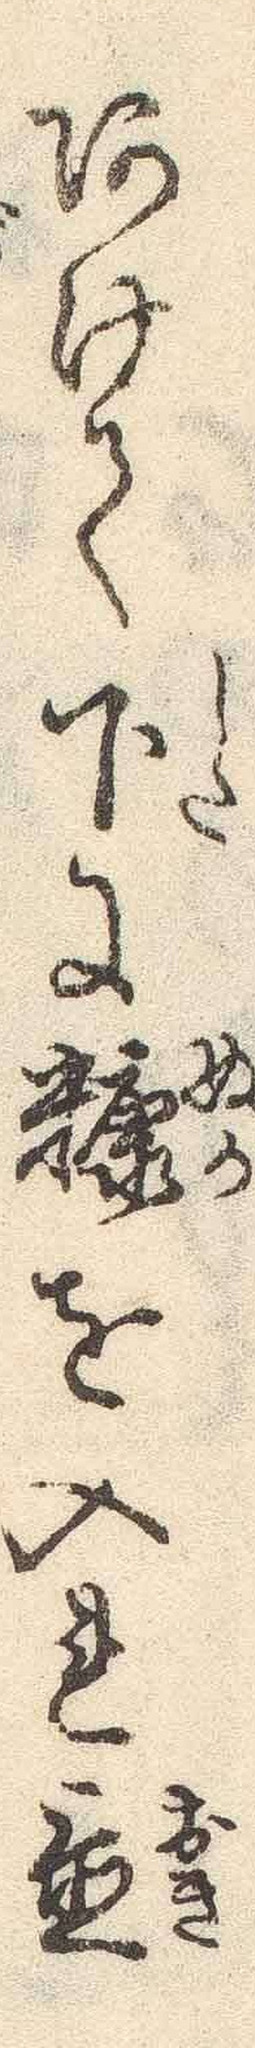あけて下に糠を入れ置
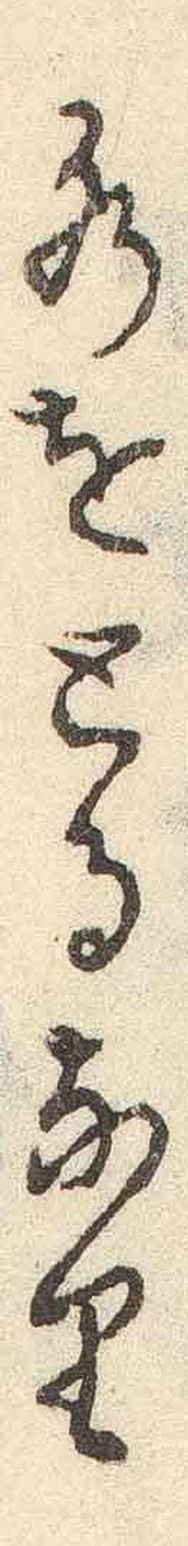水をとるなり
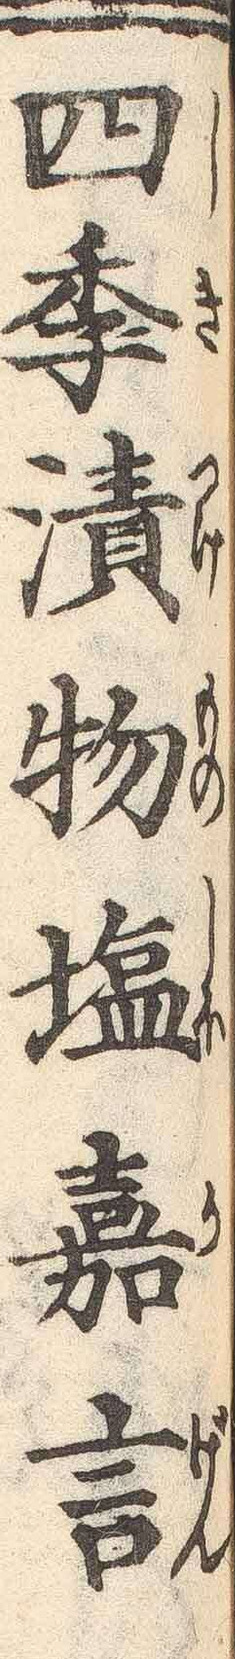四季漬物塩嘉言
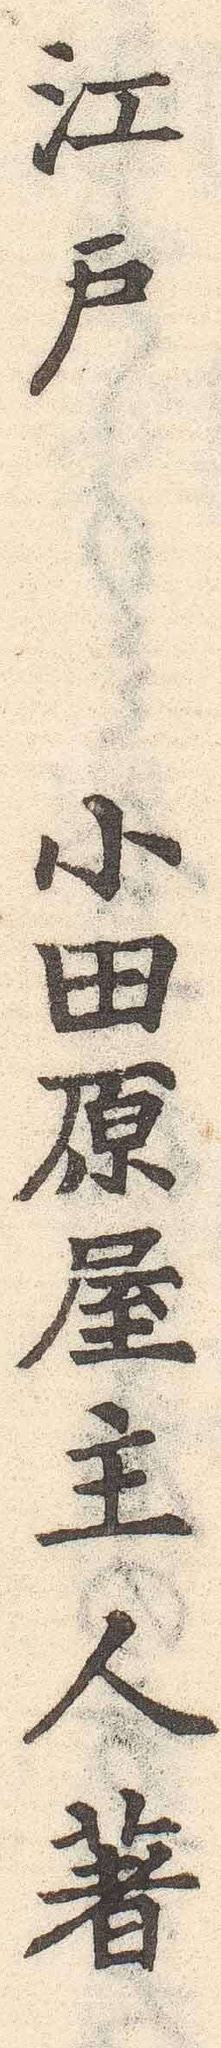江戸小田原屋主人著
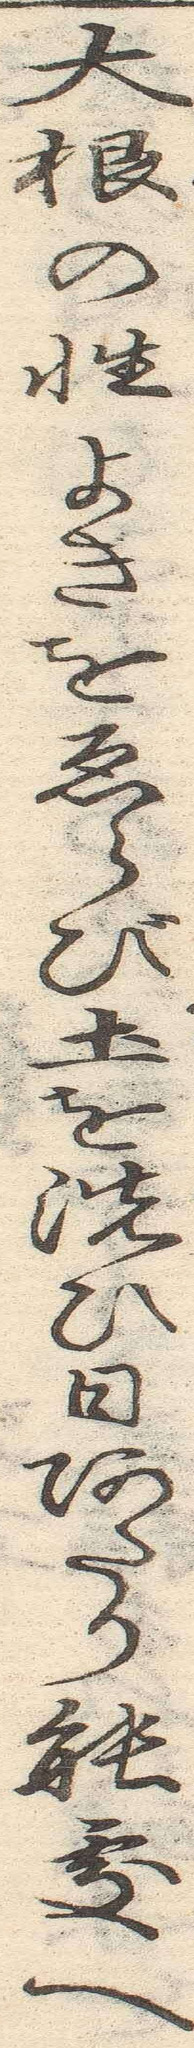大根の性よきをゑらび土を洗ひ日あたり能処へ
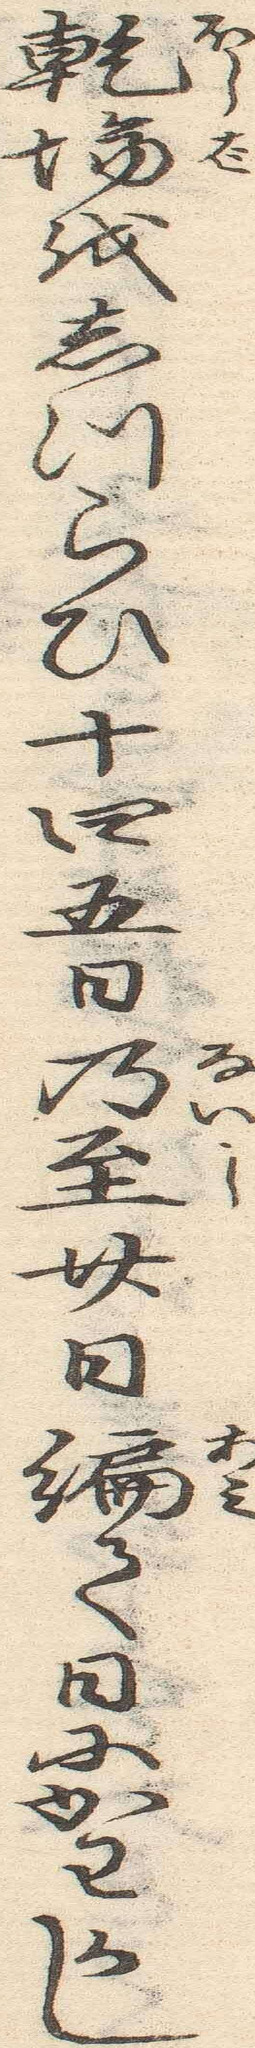乾場をしつらひ十四五日乃至廿日編て日にかわかし
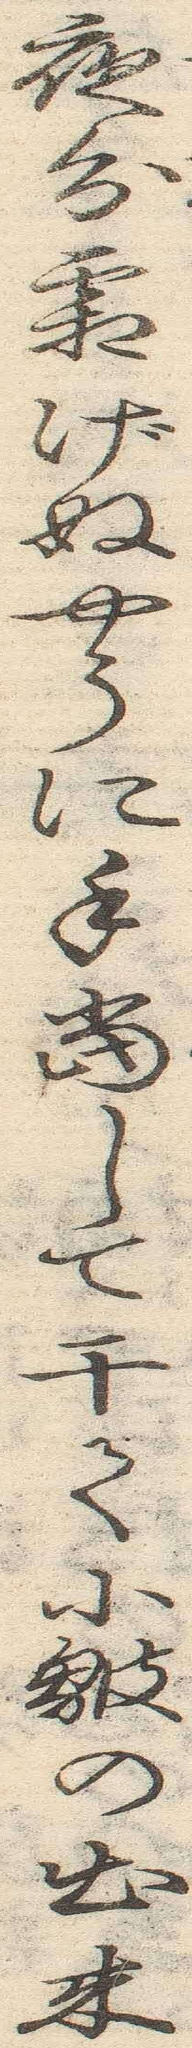夜分霜げぬやうに手当して干て小皺の出来

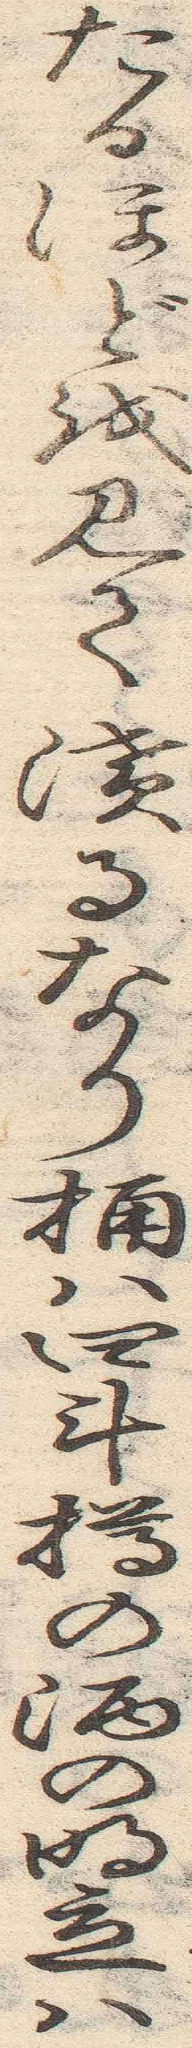たるほどをを見て漬るなり桶は四斗樽の酒の明立は
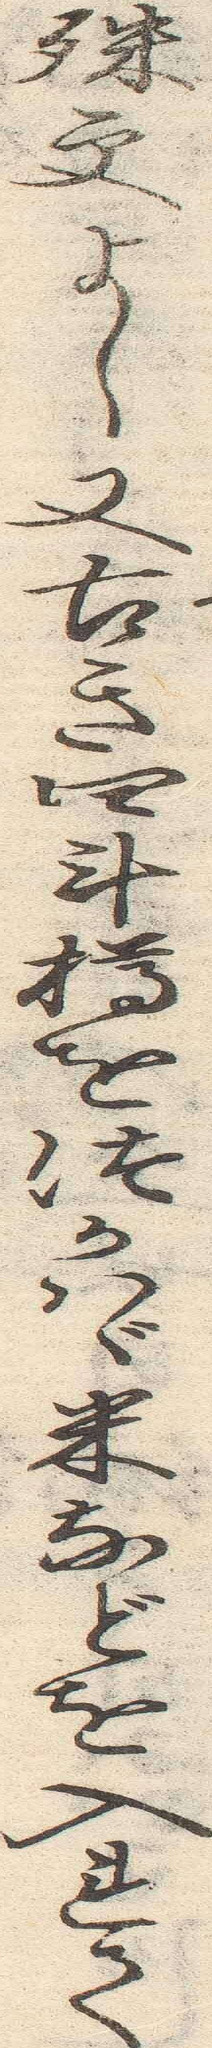殊更よし又古き四斗樽をつかはゞ米などを入れて
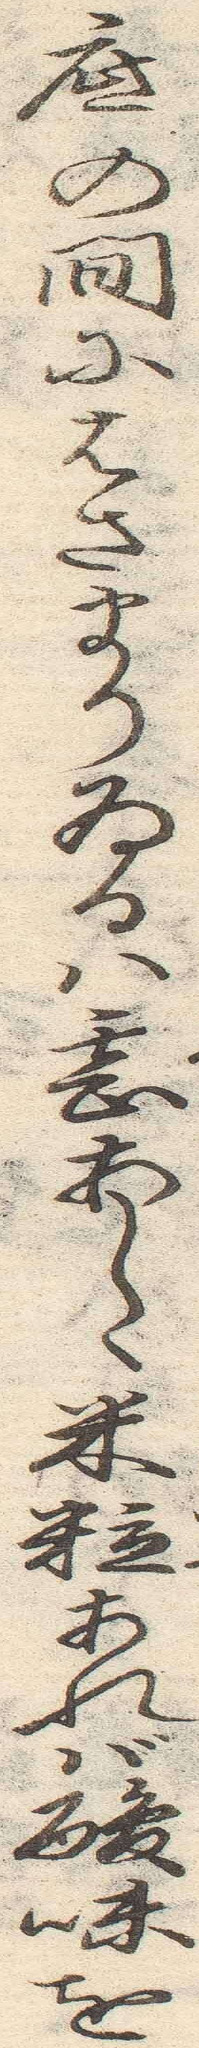底の間にはさまりゐるは甚あしく米粒あれば酸味を
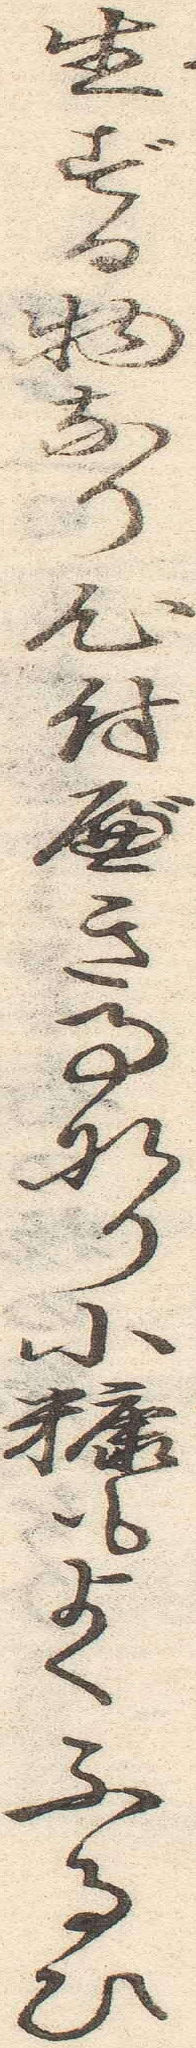生ずる物なり心付べき事なり小糠もよくふるひ
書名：四季漬物塩嘉言
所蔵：東京学芸大学附属図書館 国文学研究資料館
